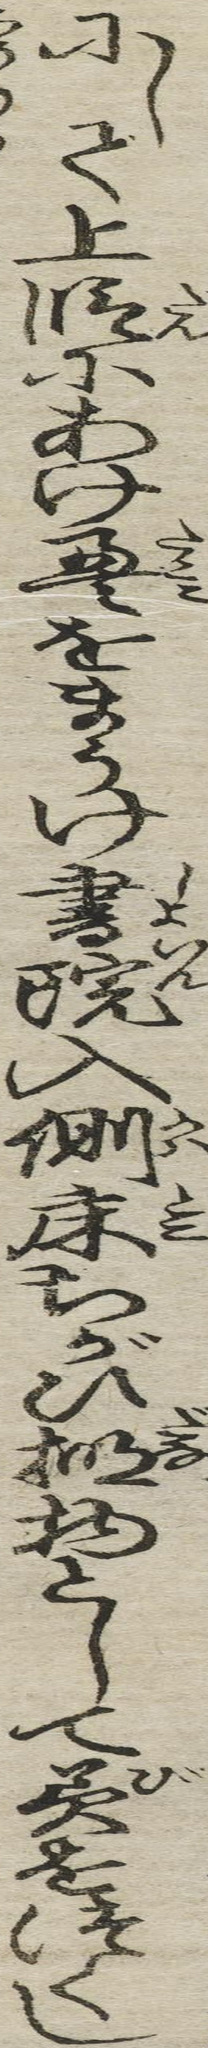にして上段にあけ畳をまうけ書院入側床ちがひ棚物として美をつくし
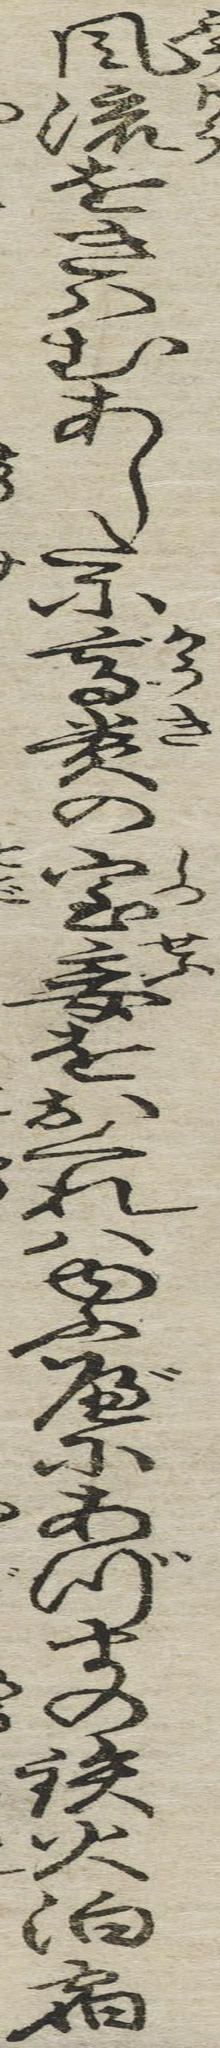風流をきはむあしたに高貴の室妾をおくれはゆふべにあづまの鉄火泊宿
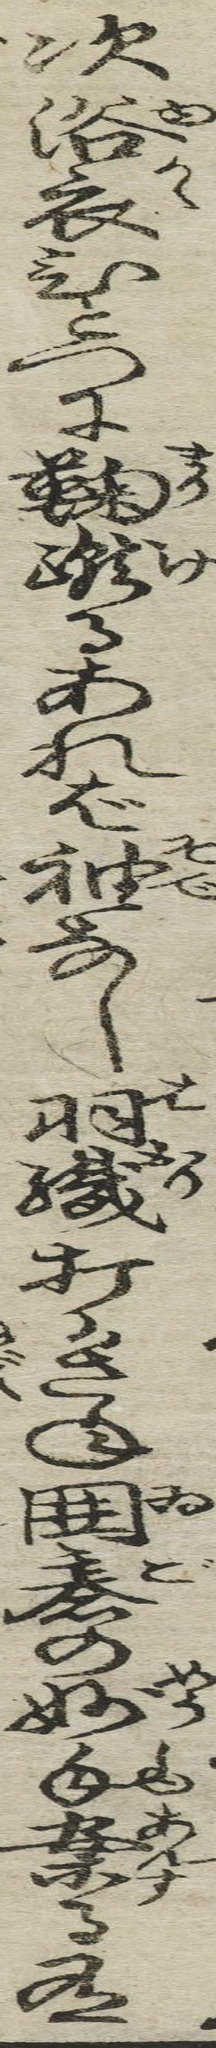す浴衣ひとつに鞠蹴るあれば袖なし羽織打かさね囲碁の妙手案る有
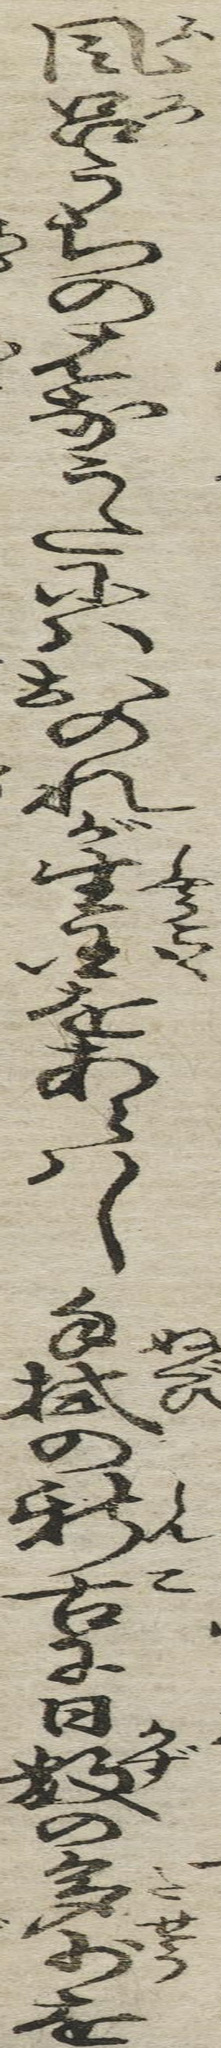風呂うちのはなうたにはおのれが生国をあらはし手拭の新古に日数の多少を
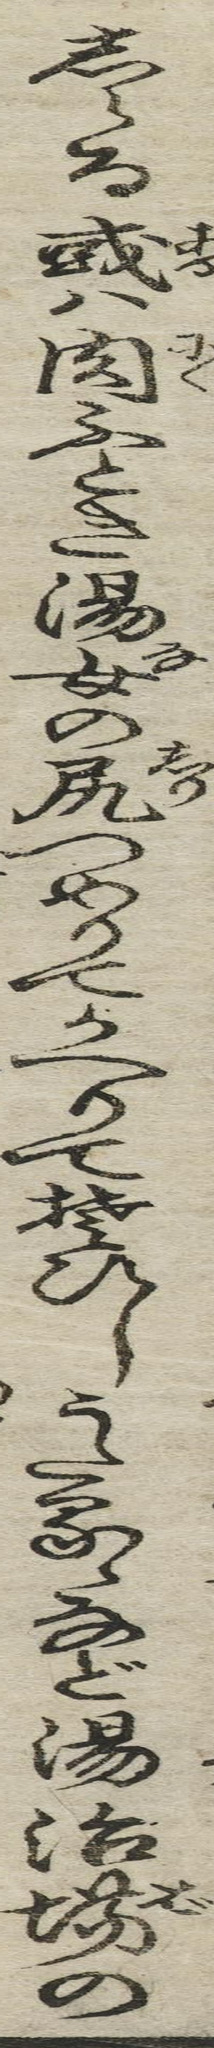しらる或は肉ふとき湯女の尻つめりてかへりてそひしうたるゝなど湯治場の
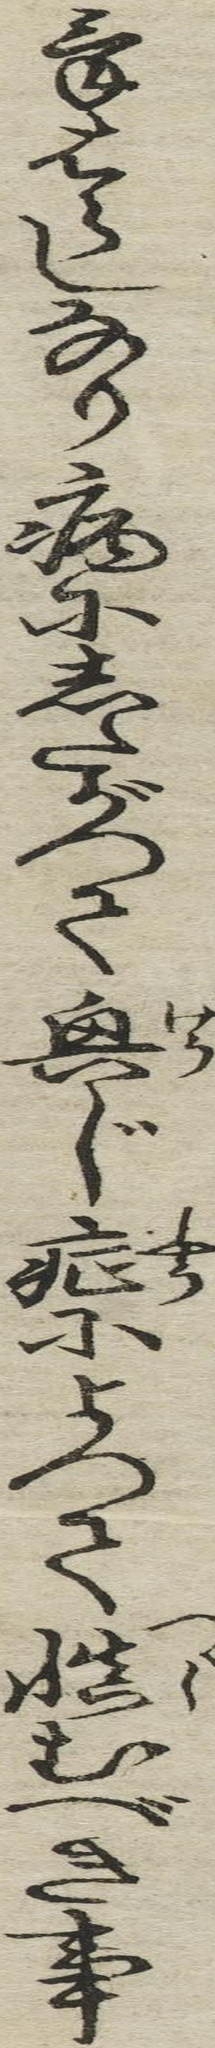氣はらしなり病にしたがつて興じ症によつて愼むべき事

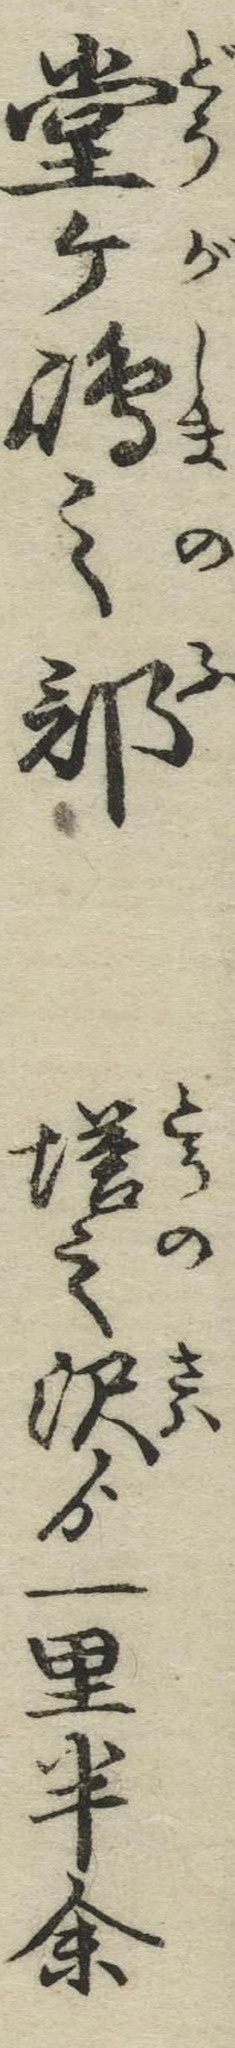堂ヶ嶋之部塔之沢より一里半余
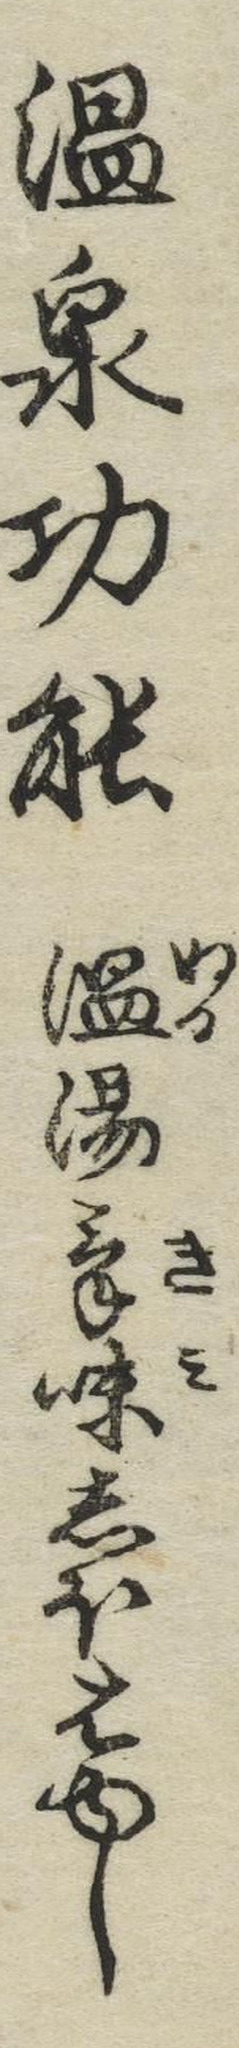温泉功能温湯氣味しほはゆし
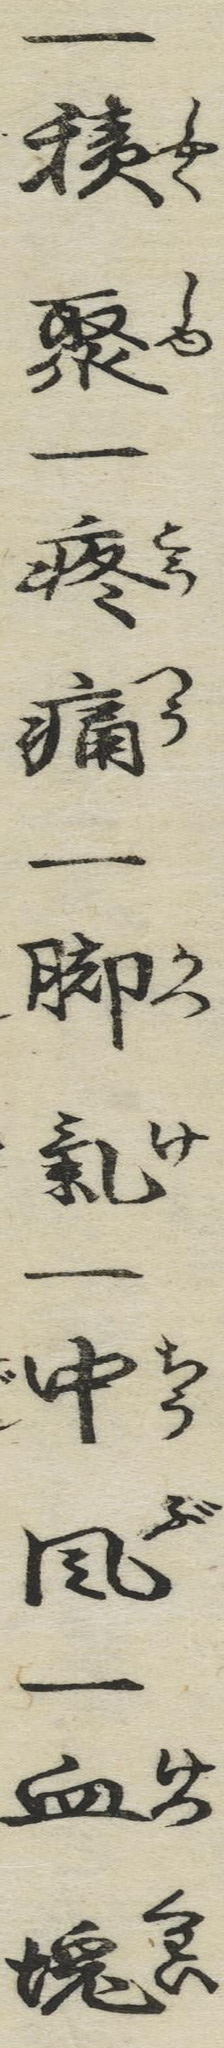一積聚一疼痛一脚氣一中風一血塊
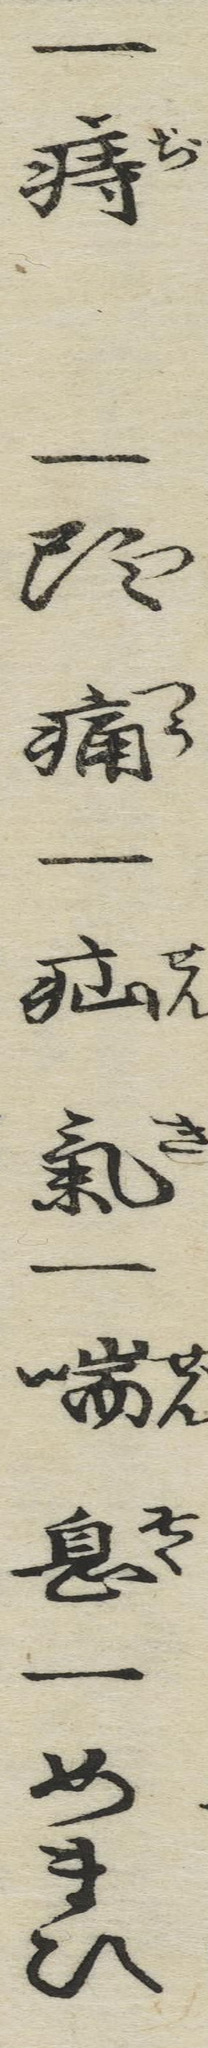一痔一頭痛一疝気一喘息一めまひ
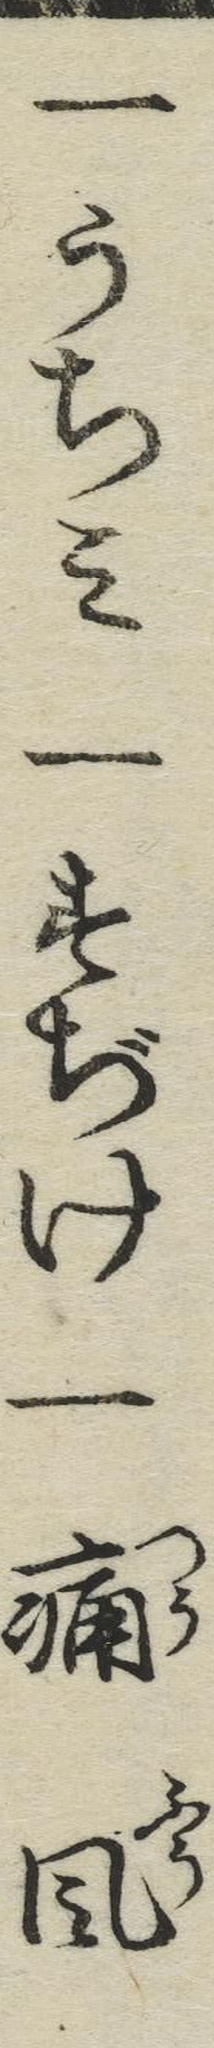一うちみ一すぢけ一痛風
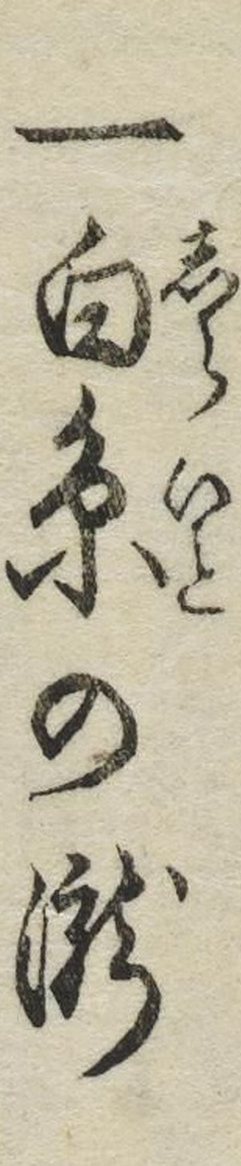一白糸の瀧
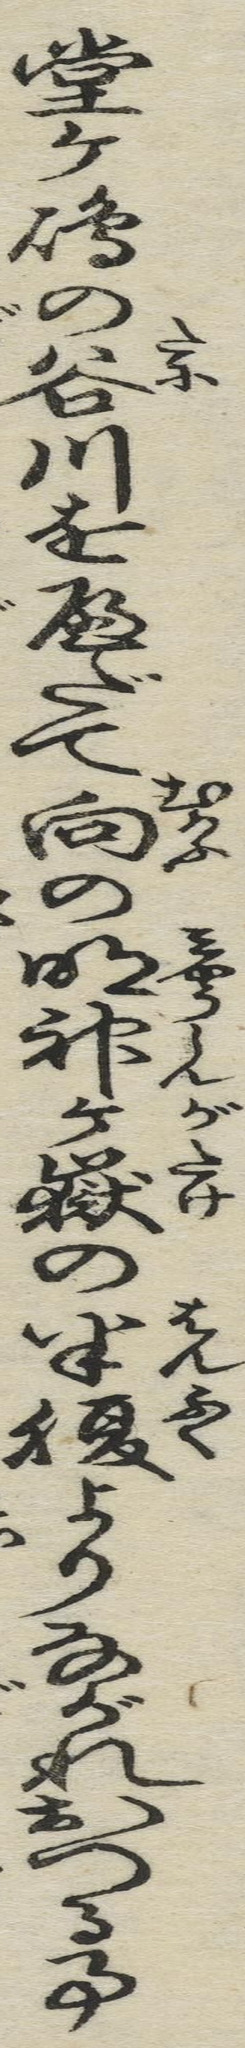堂ヶ島の谷川をへだて向の明神ヶ嶽の半腹よりながれおつる事
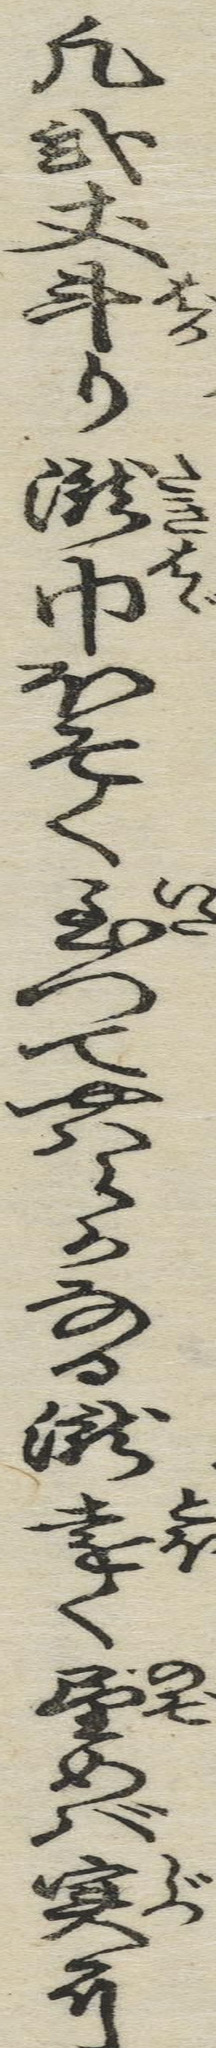凢弐丈斗り瀧巾ほそく至つてやはらかなる瀧遠く望めば実に
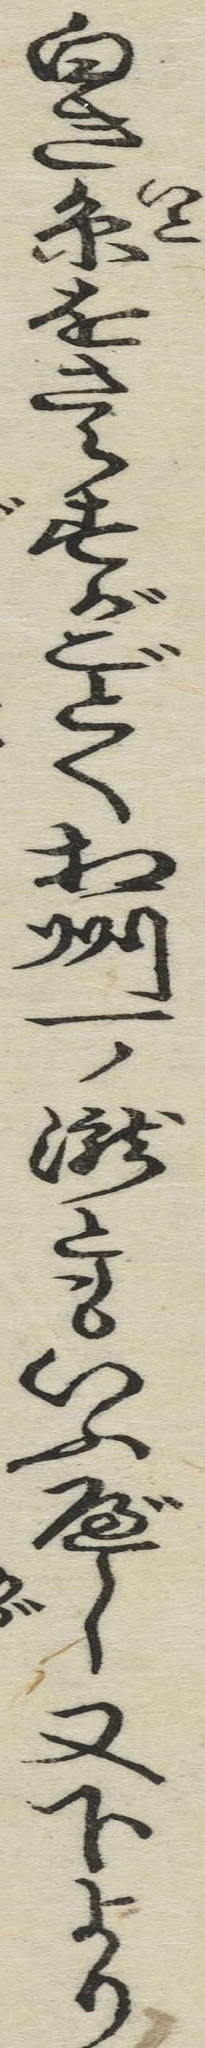白き糸をさらすがごとく相州一ノ瀧ともいふべし又下より
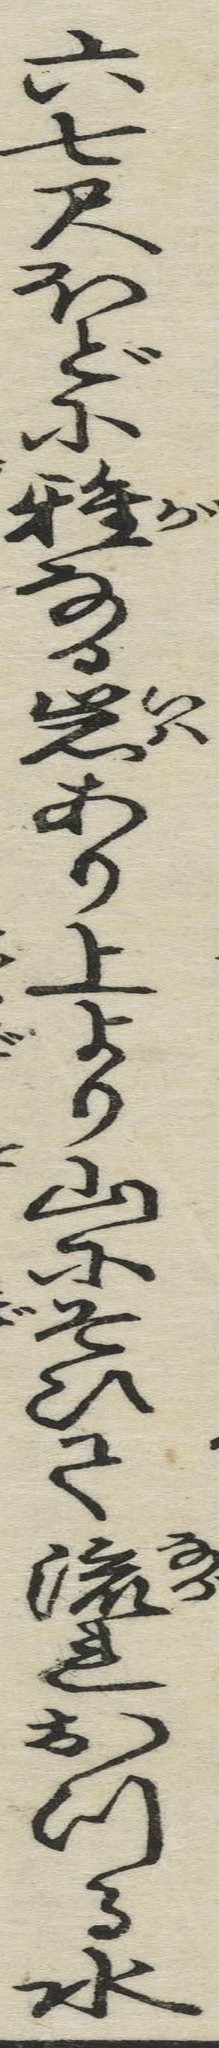六七尺ほどに雅なる岩あり上より山にそひて流れおつる水
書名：箱根七湯　温泉圖會　全
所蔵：東京大学地震研究所図書室 Earthquake Research Institute Library, The University of Tokyo, JAPAN
